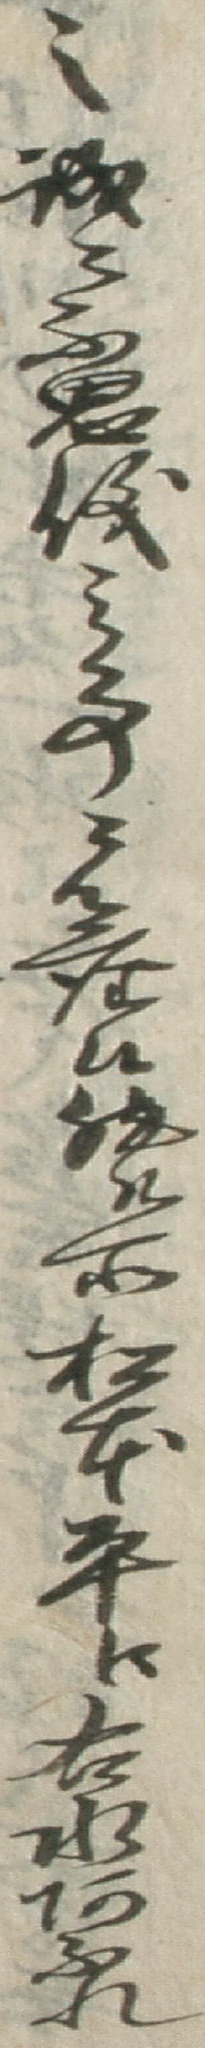之誠不思議之事二御座候然ㇽ所松本平江右水あふれ
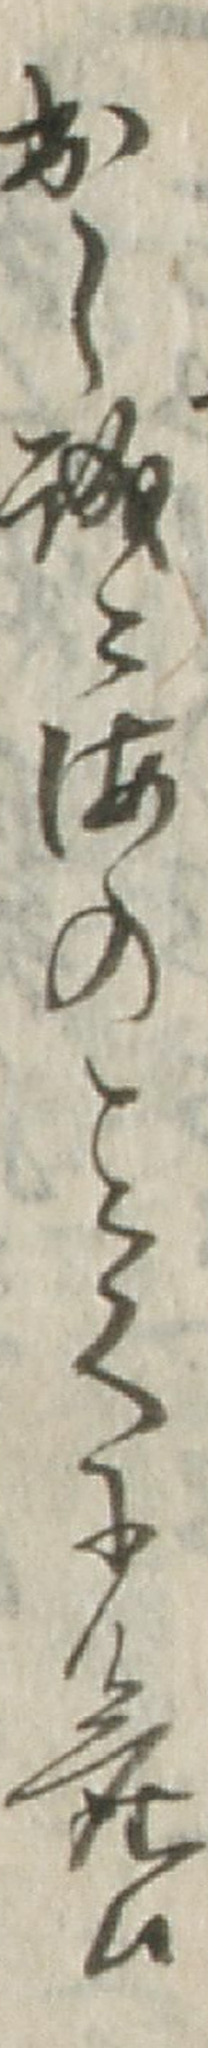出し誠二海のことく二御座候
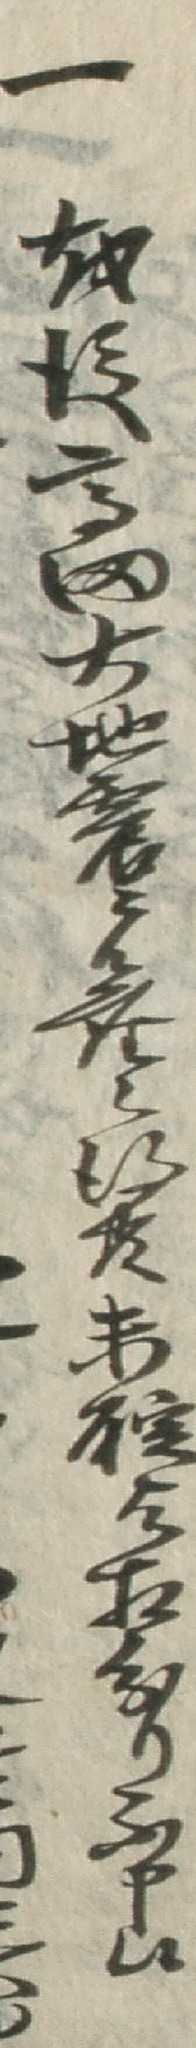一越後高田大地震二御座候得共未聢と相分り不申候
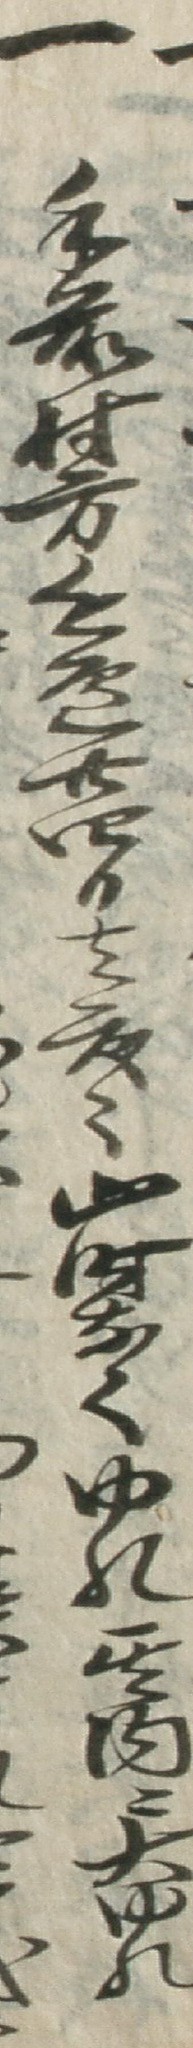一手前村方近辺廿四日は夜々止時なくゆれ其内二大ゆれ
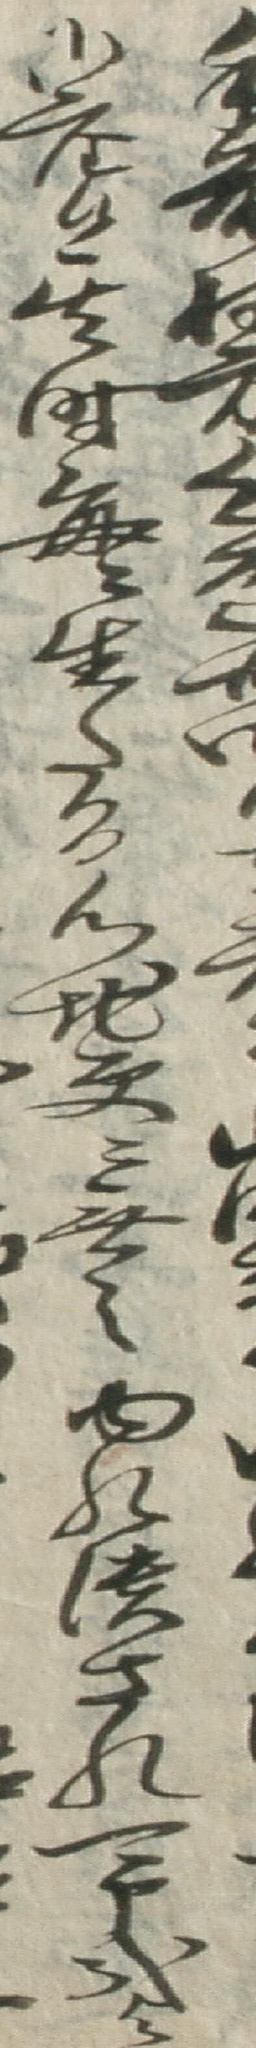御座候其時毎二生たる心地更二無之ゆれ潰され可申哉と
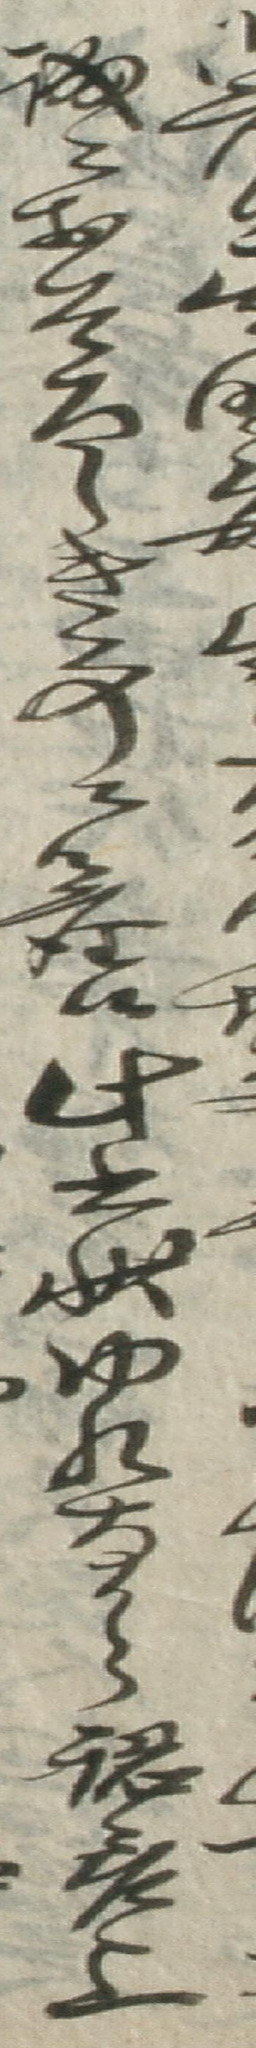誠二おそろしき事二御座候此書状ゆれなから認差上
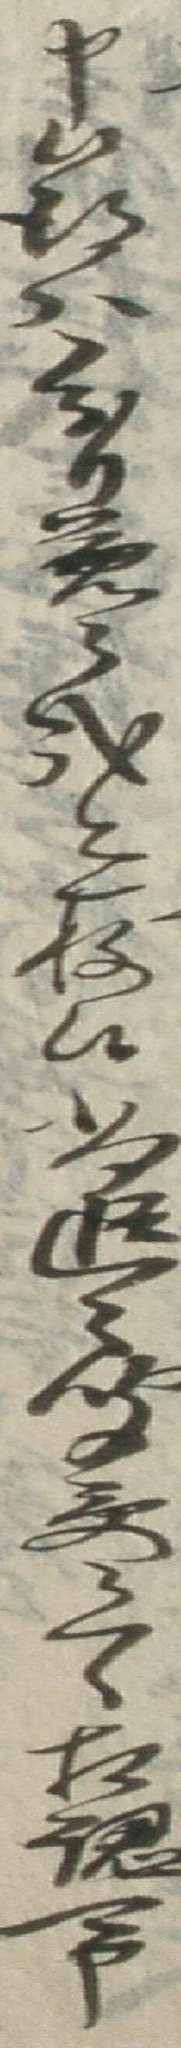申候得ハ分り兼候哉と存候尚追々聞受候ハゝ相認可申
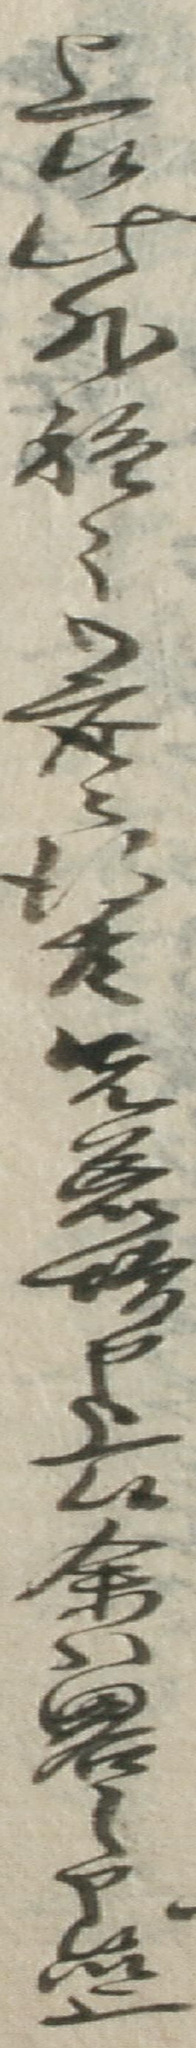上候此外種々御座候得共先荒増申上候余ハ略し申候以上
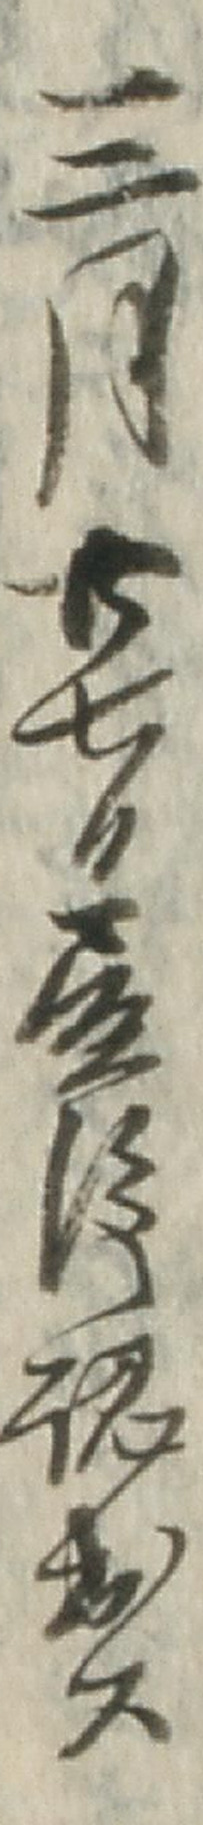三月廿七日昼後認出ス
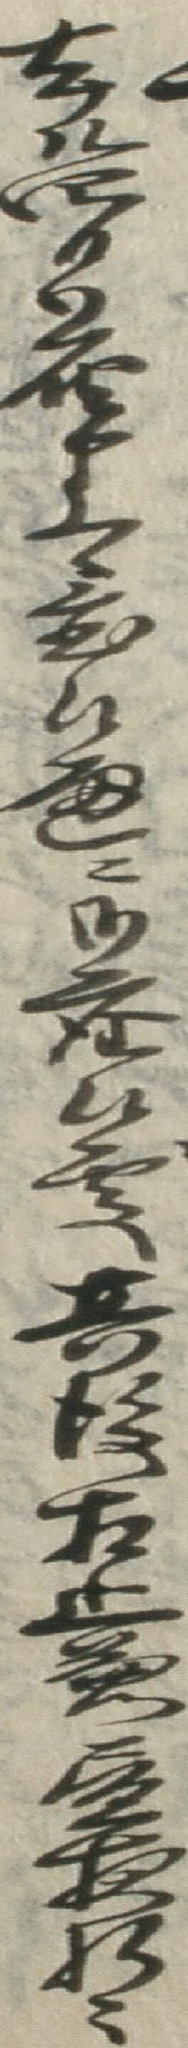去ㇽ四日御届申上置候通二御座候処其後相止兼昼夜折々
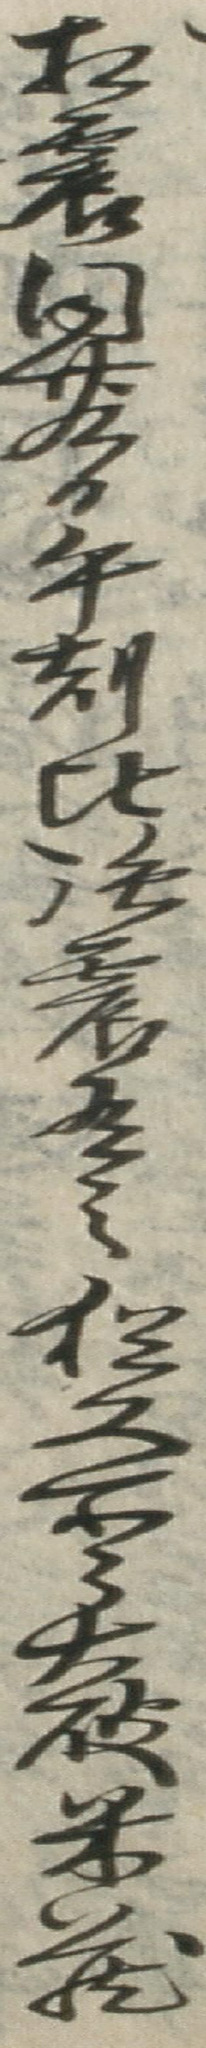相震同廿九日午刻比強震有之尚又所々大破米蔵
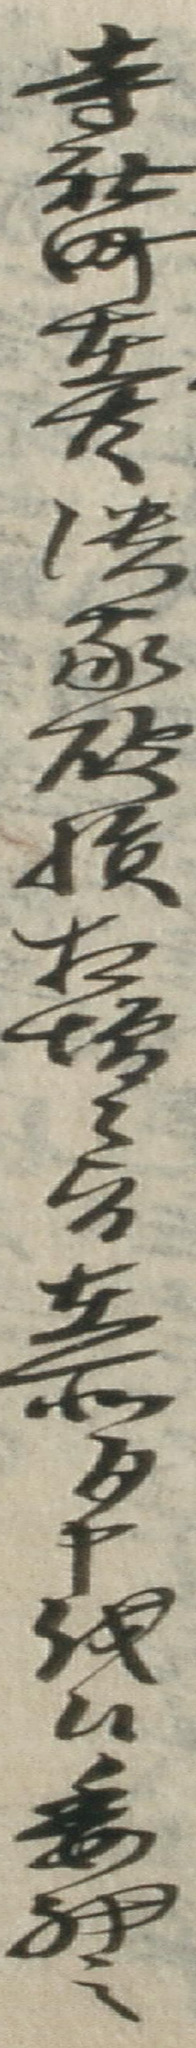寺社町在共潰家破損相増候旨在所ゟ申越候委細之
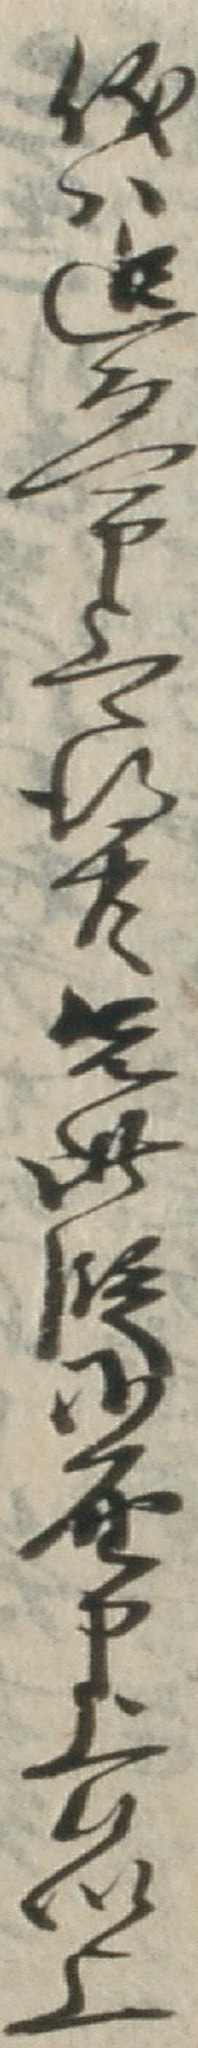儀ハ追而可申上候得共先此段御届申上候以上
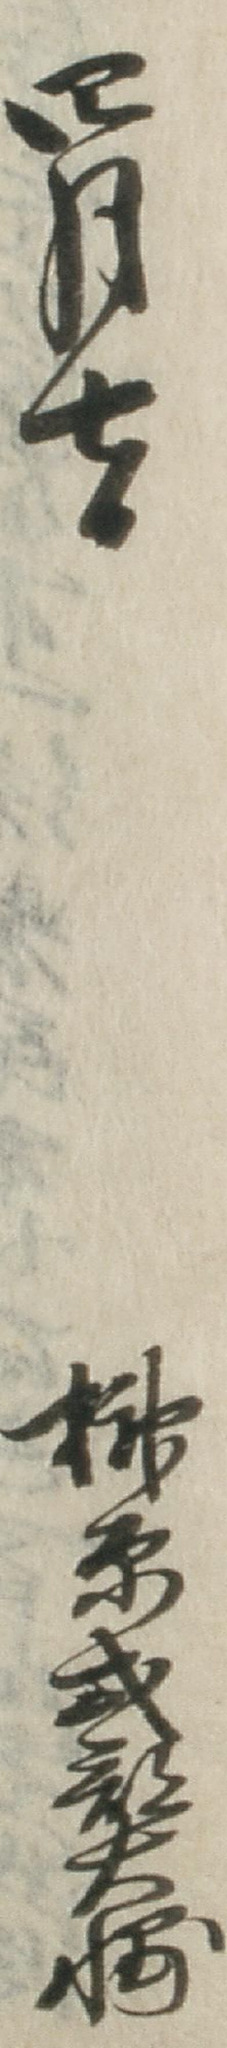四月七日榊原式部太輔
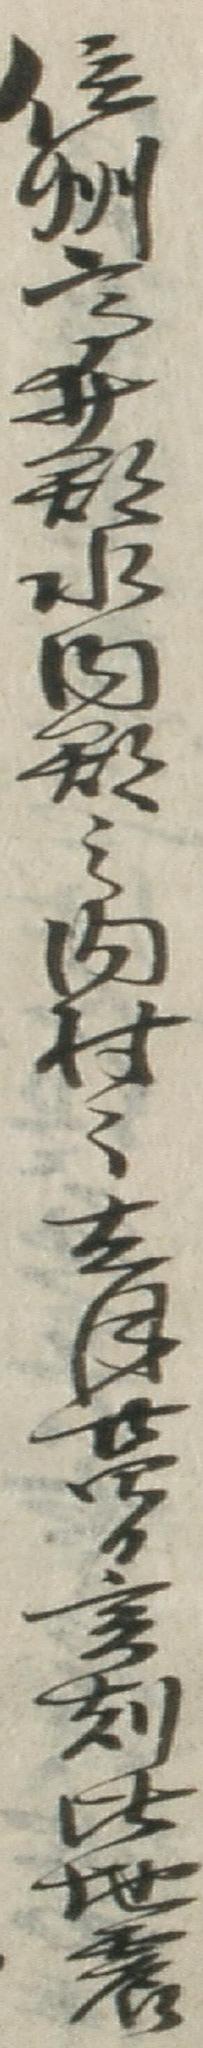信州高井郡水内郡之内村々去月廿四日亥刻比地震
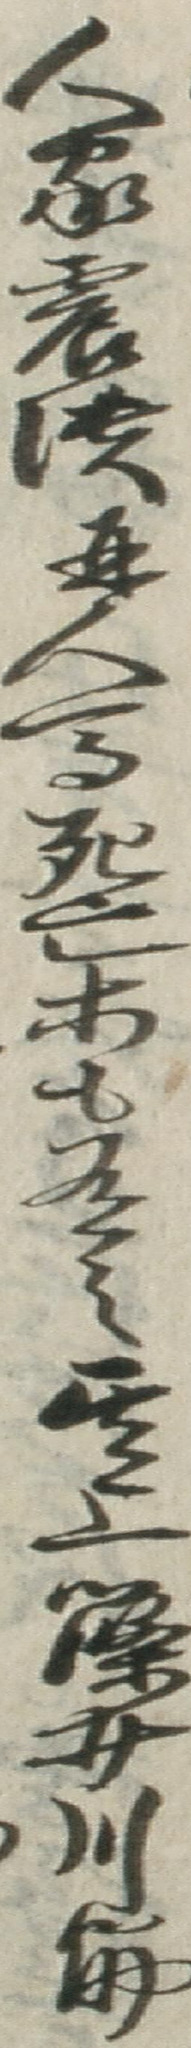人家震潰并人馬死亡等も有之其上篠井川筋
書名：信濃國地震實録記
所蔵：東京大学地震研究所図書室 Earthquake Research Institute Library, The University of Tokyo, JAPAN
